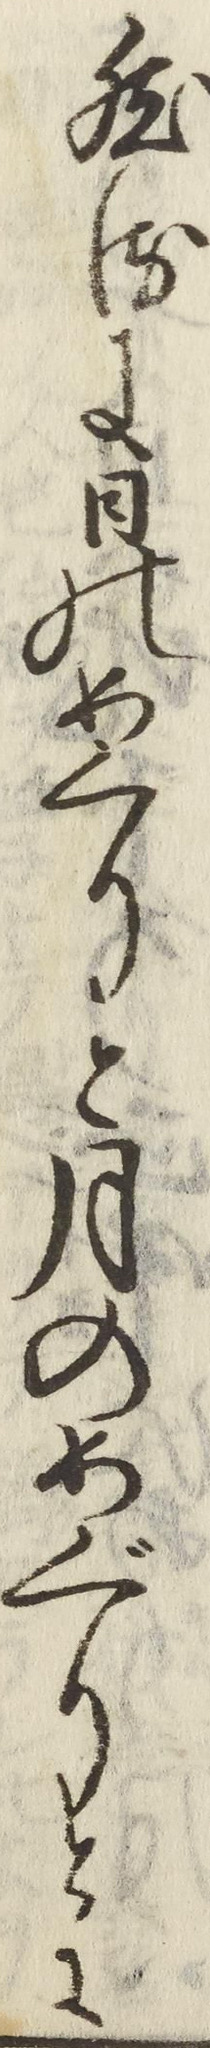然るに日のめくりと月のめぐりとに

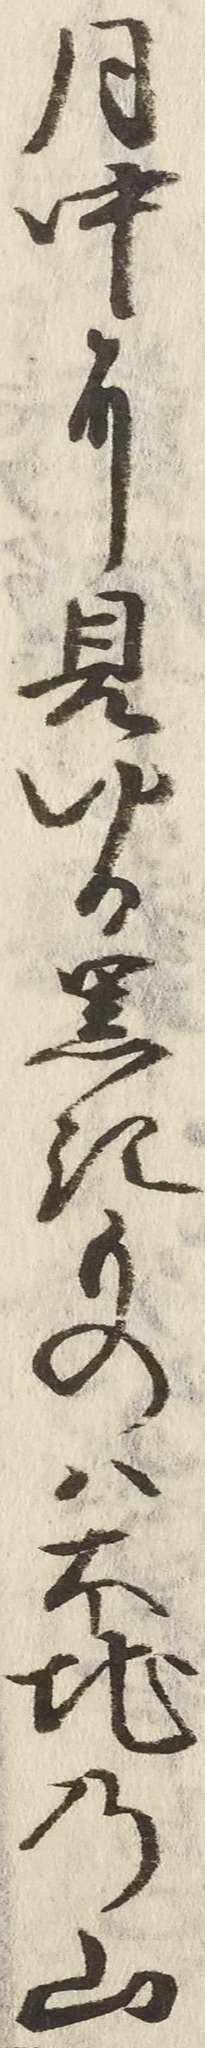月中に見ゆる黒きものは大地の山
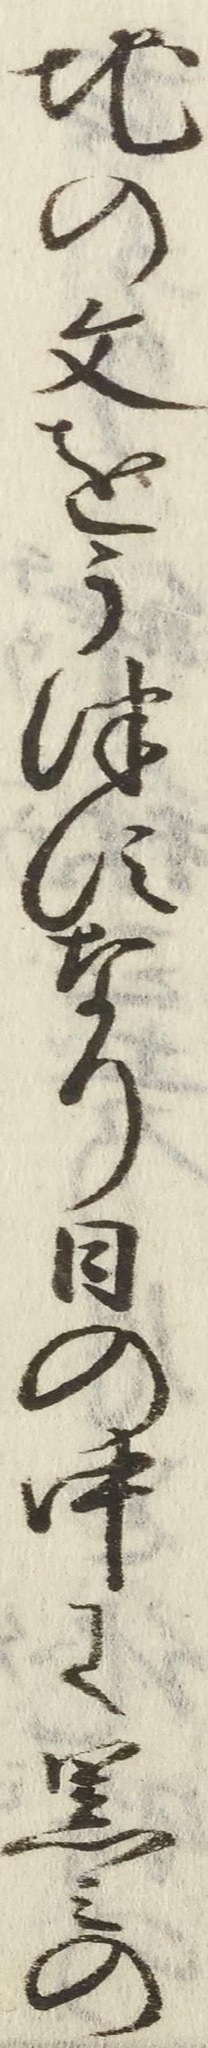地の文をうつすなり日の中に黒みの

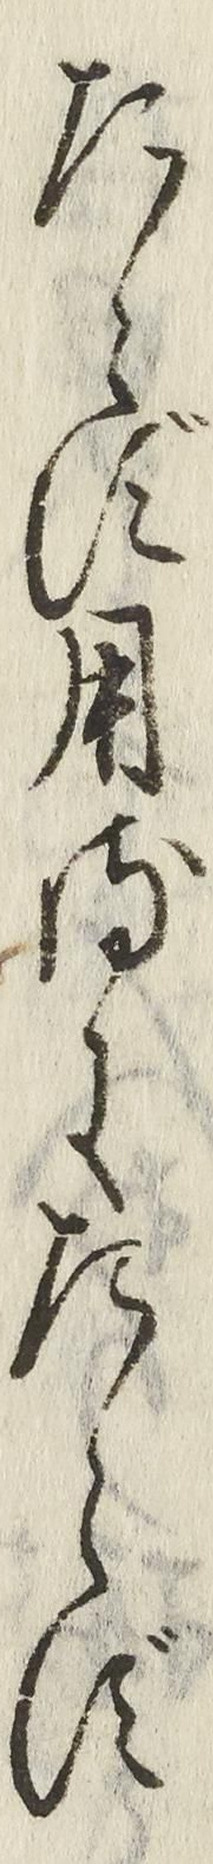たらず用るにたらず

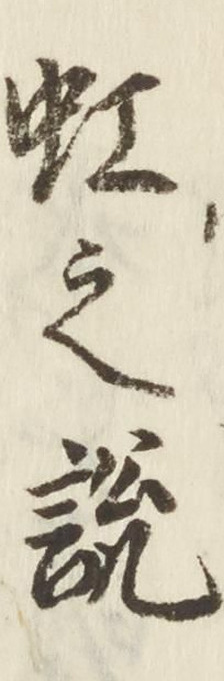虹之説

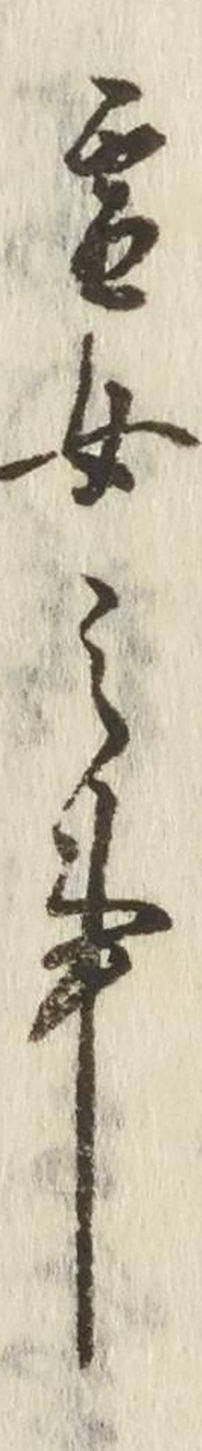雪女の事
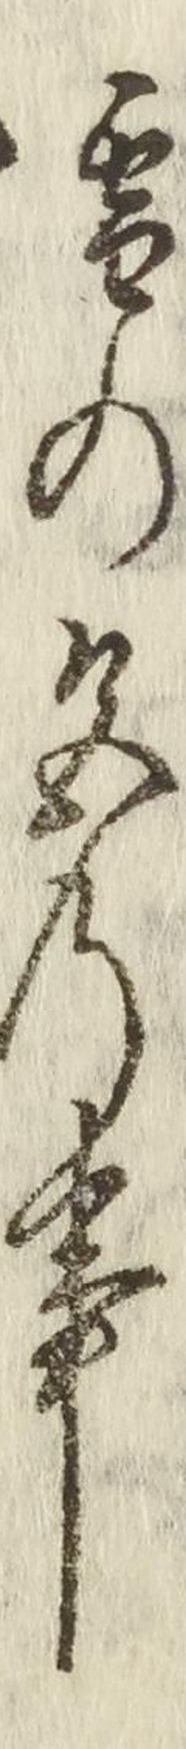雪の冬の事
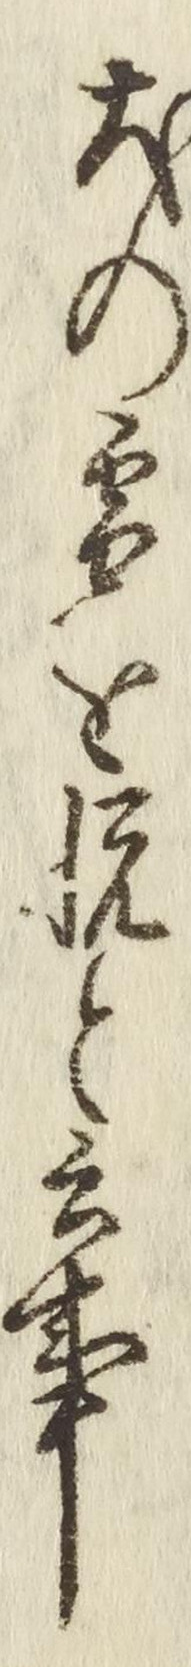犬の雪を悦と云事
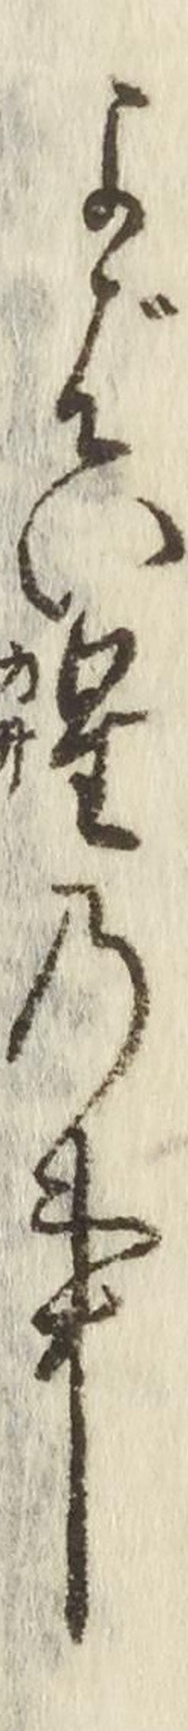よばい星の事
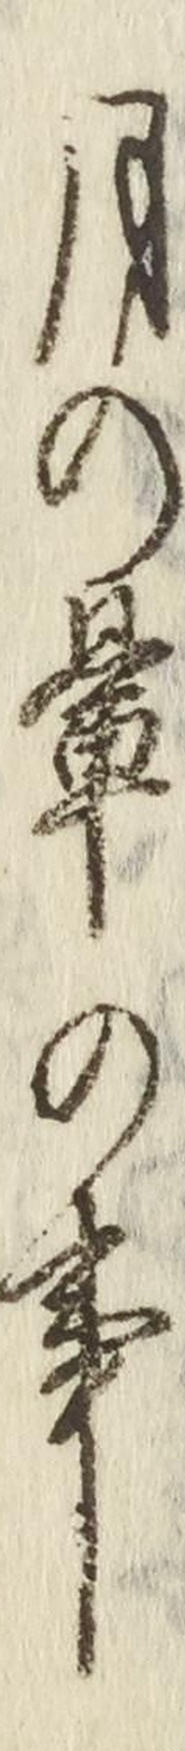雪の冬の事

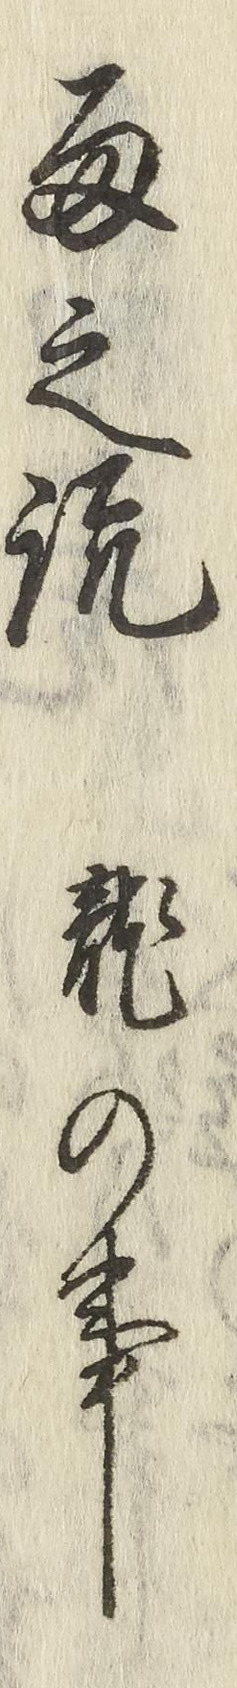雨之説龍の事
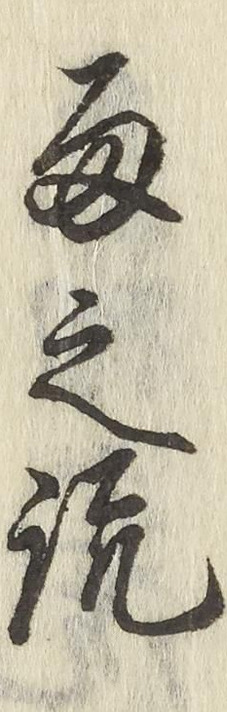雪之説
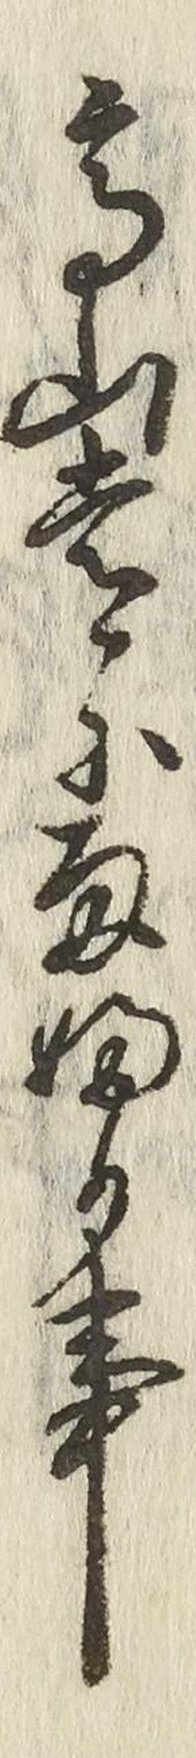高山常に雨ふる事
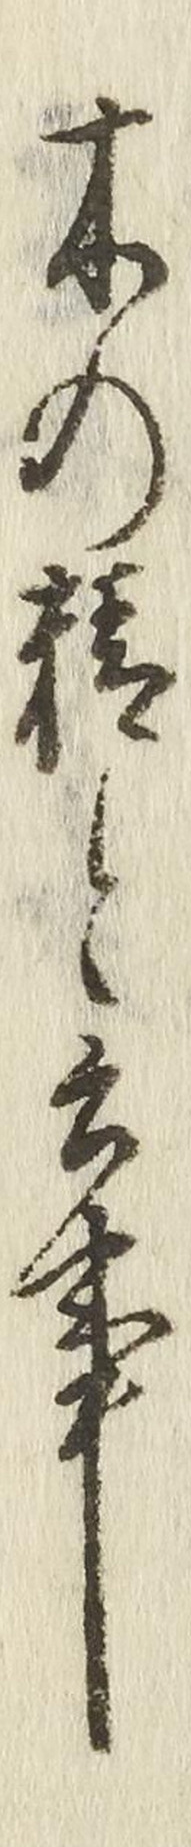木の精と云事
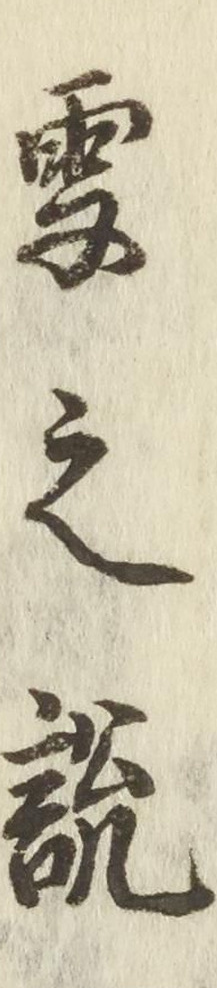雪之説

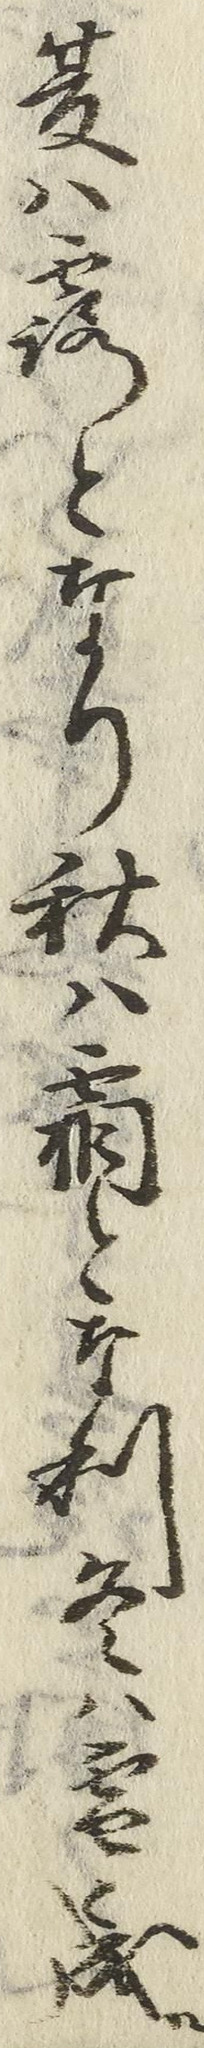夏は露となり秋は霜となり冬は雪と成
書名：天地或問珍　天
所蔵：東京大学地震研究所図書室 Earthquake Research Institute Library, The University of Tokyo, JAPAN
